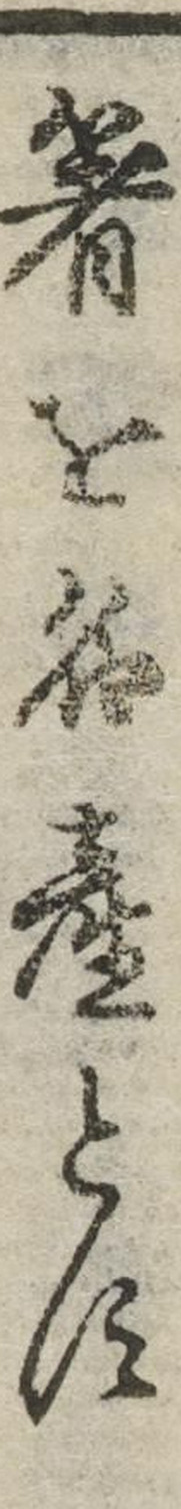箸を名産とす
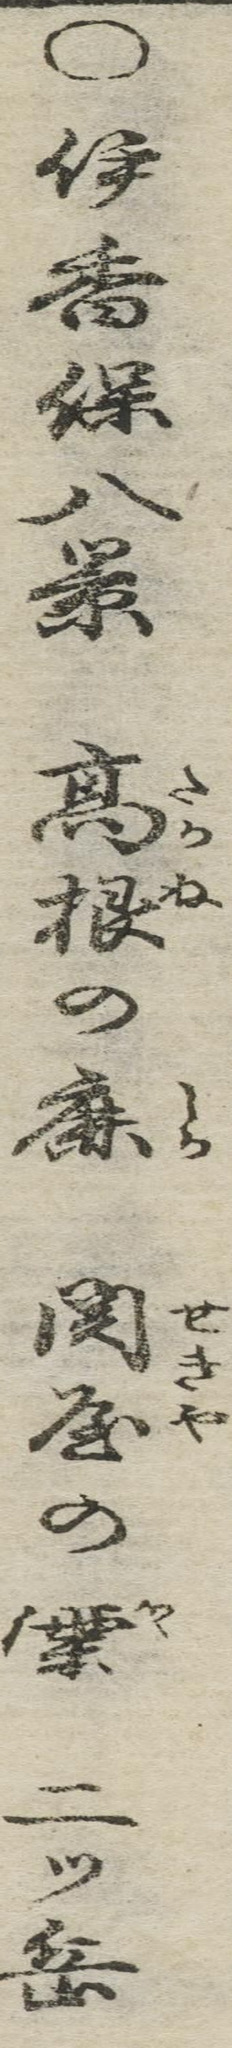○伊香保八景高根の鹿関屋の二ッ岳
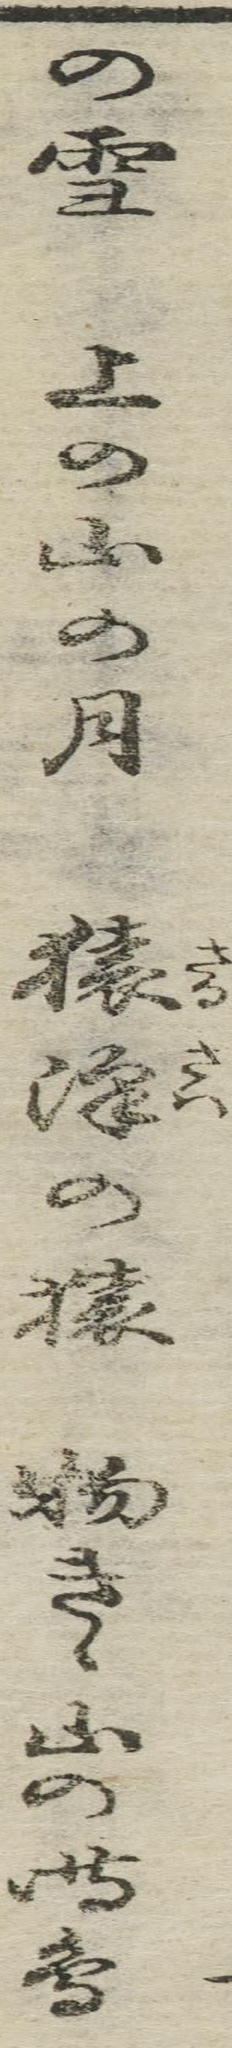の雪上の山の月猿澤の猿物きゝ山の時象
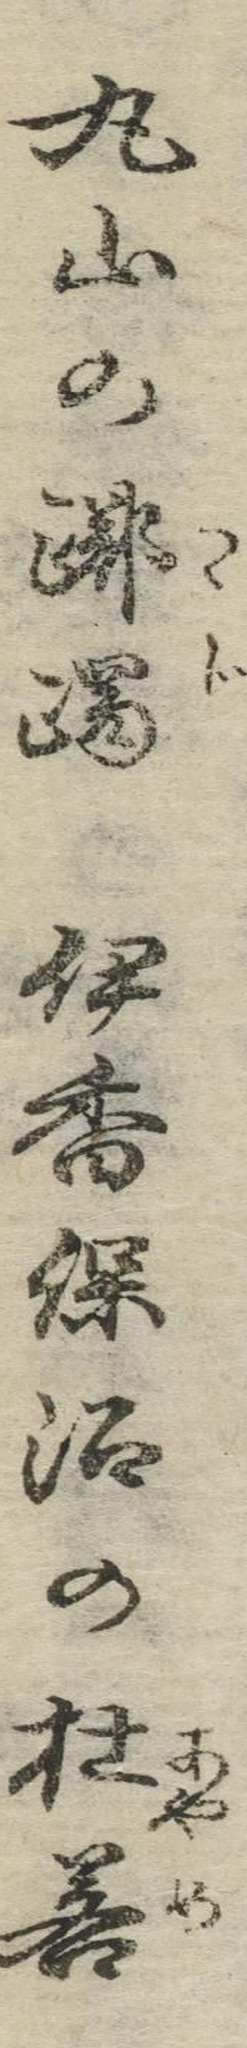丸山の躑躅伊香保沼の杜若

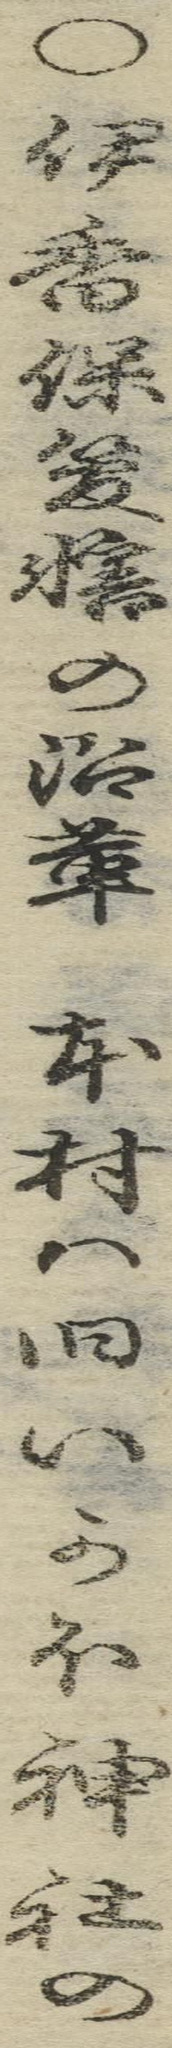○伊香保管轄の沿革本村は旧いかほ神社の
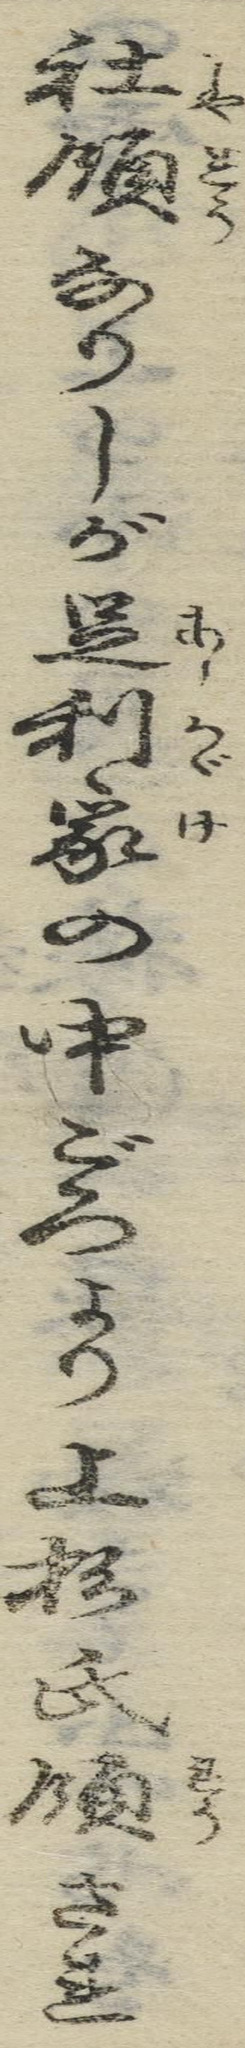社領なりしが足利家の中ごろより上杉氏領され
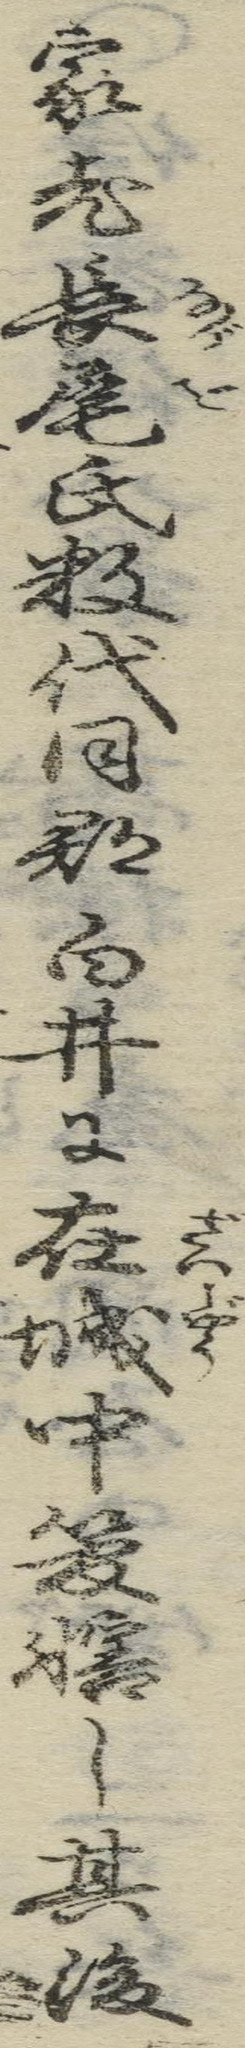家老長尾氏数代同郡白井に在城中管轄し其後
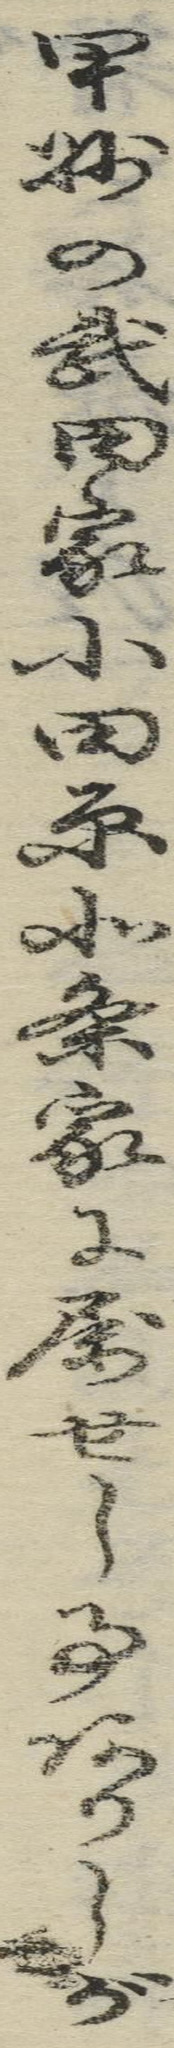甲州の武田家小田原北条家に属せし事ありしが
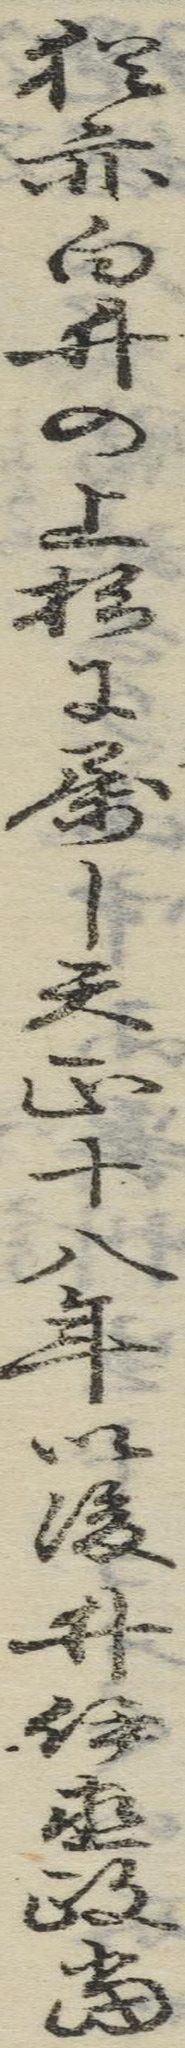程亦白井の上杉に属し天正十八年以後井伊直政当
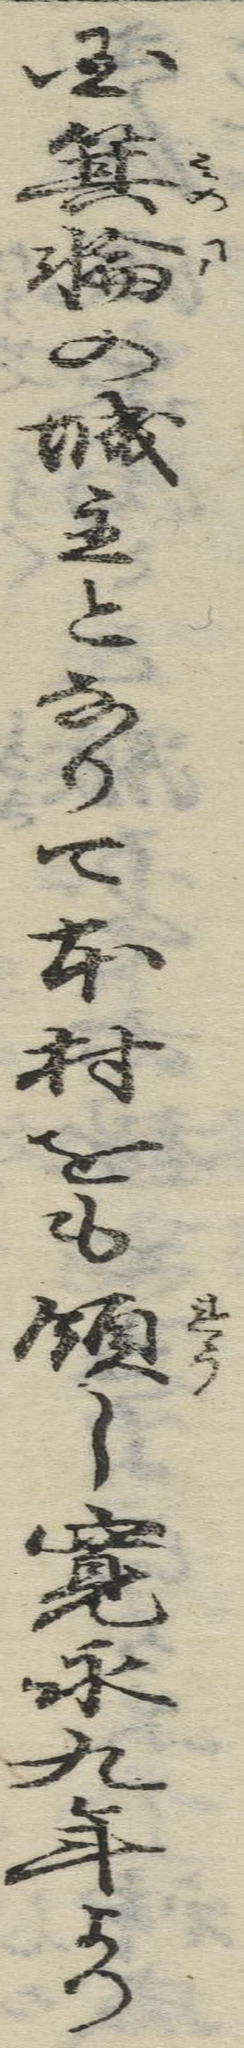国箕輪の城主となりて本村をも領し寛永九年より
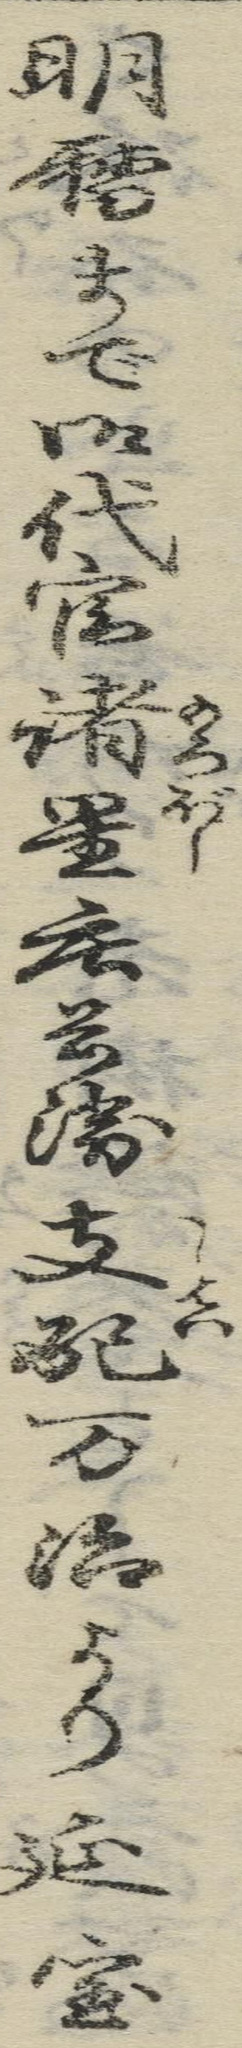明暦まで御代官諸星庄兵衛支配万治より延宝
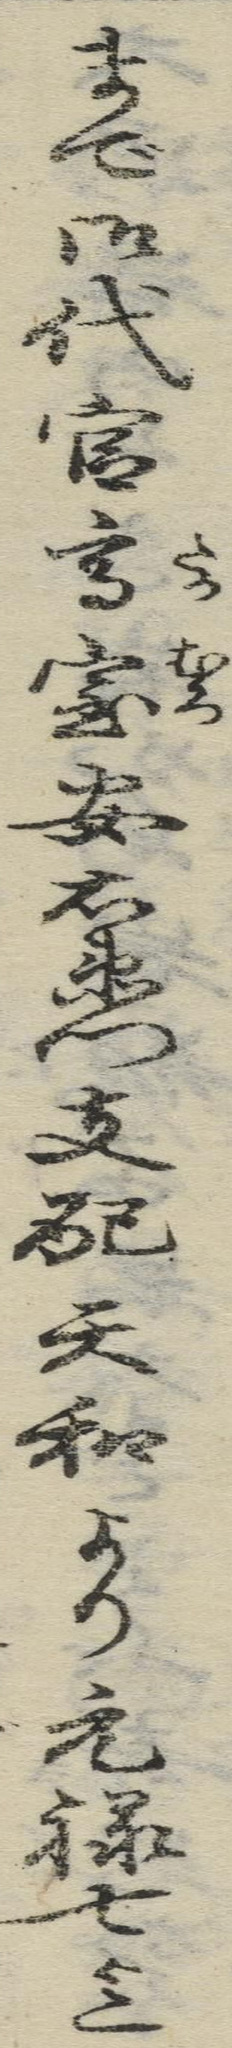まで御代官高室安右衛門支配天和より元禄七迄
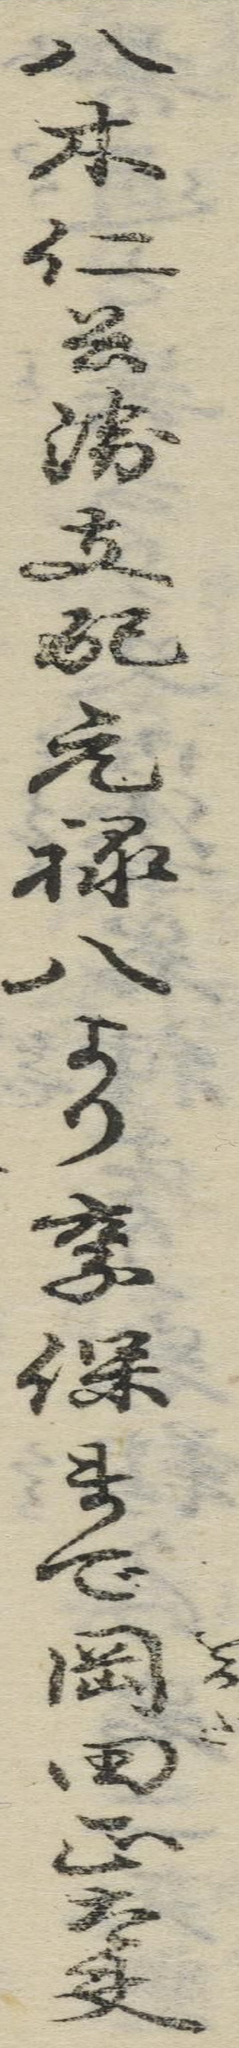八木仁兵衛支配元禄八より享保まで岡田正太夫
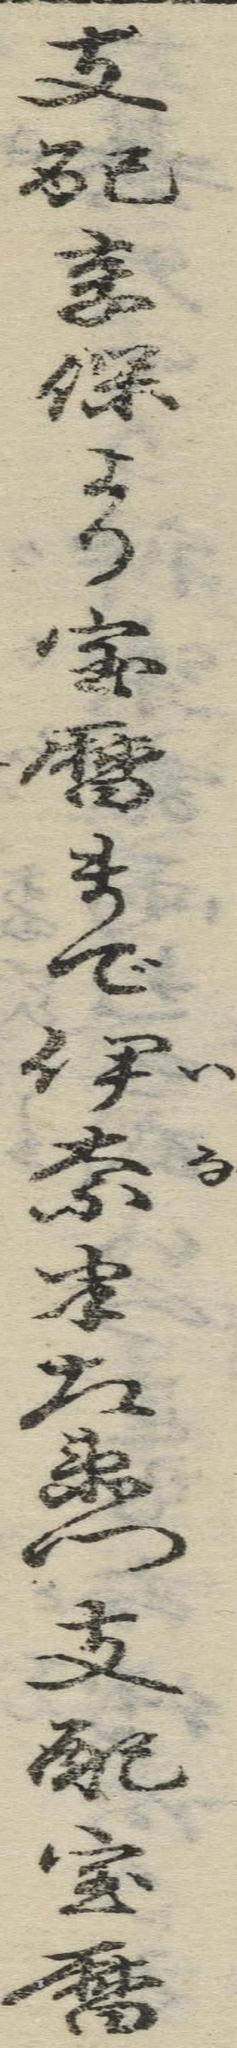支配享保より宝暦まで伊奈半左衛門支配宝暦
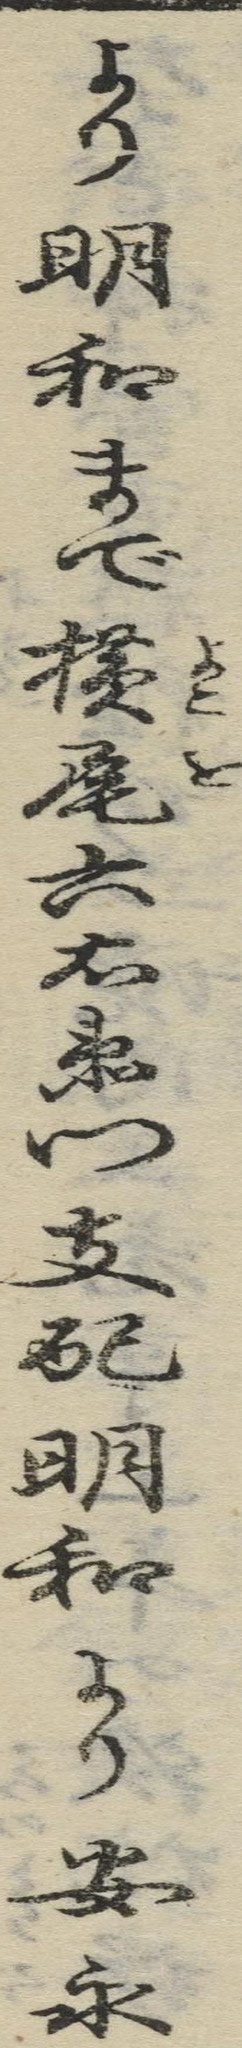より明和まで横尾六右衛門支配明和より安永
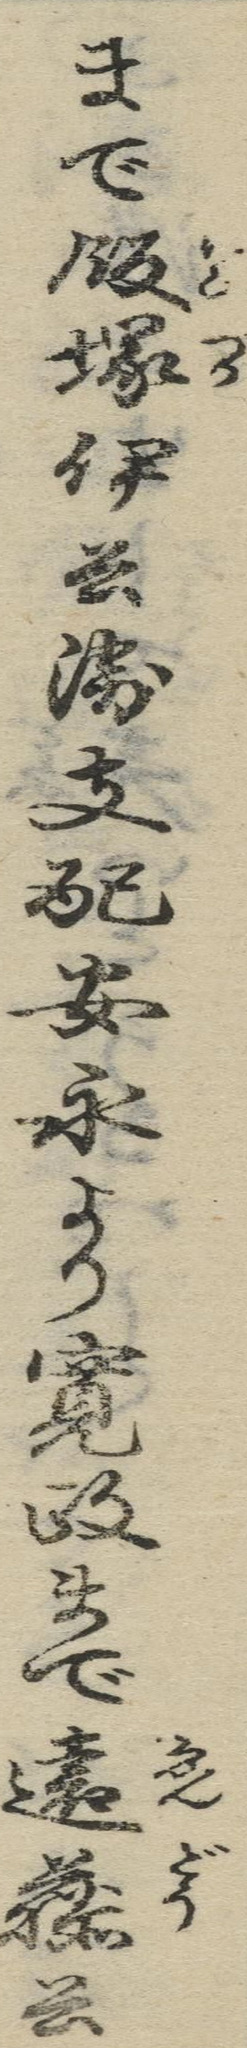まで飯塚伊兵衛支配安永より寛政まで遠藤兵
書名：上州伊香保鑛泉圖會　全
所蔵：東京大学地震研究所図書室 Earthquake Research Institute Library, The University of Tokyo, JAPAN
